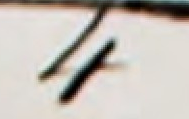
4
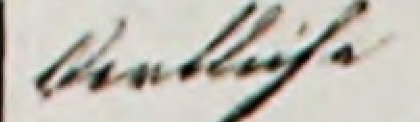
Vertliche
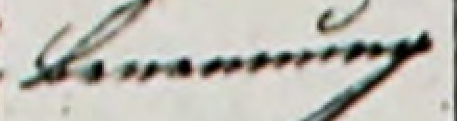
Benennung
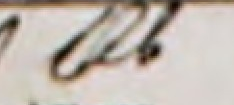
Ab
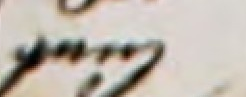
ganz
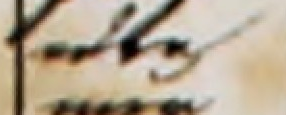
oder
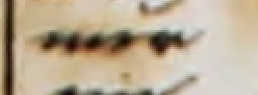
nur
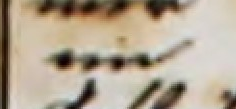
ein
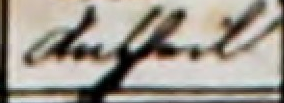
Antheil
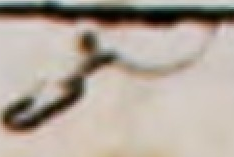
5
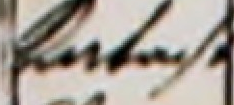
Katast
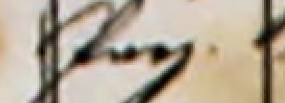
Parz.
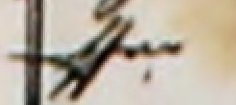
ffer
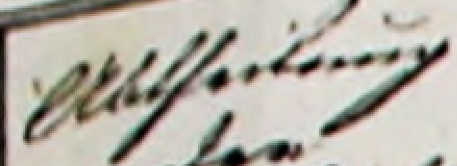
Abthei„
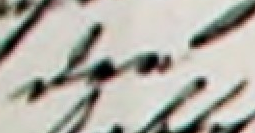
lung
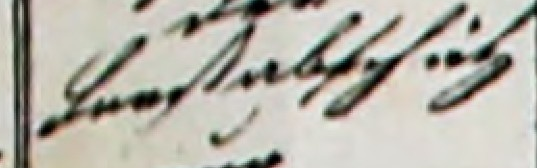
der
